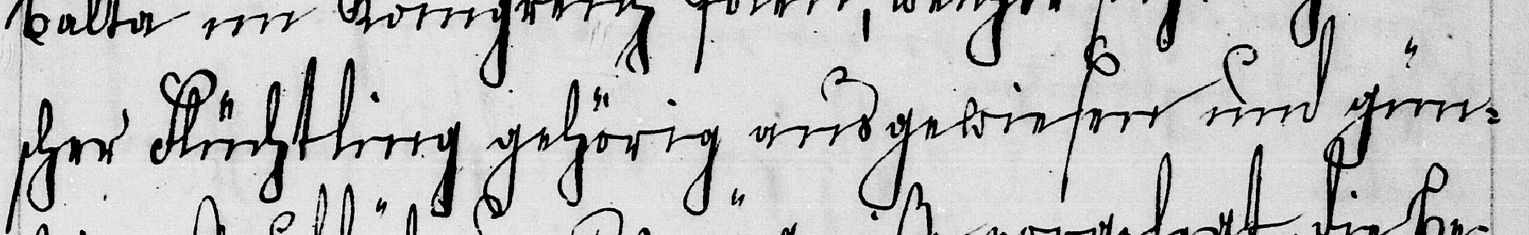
scher Flüchtling gehörig ausgewiesen und gün¬
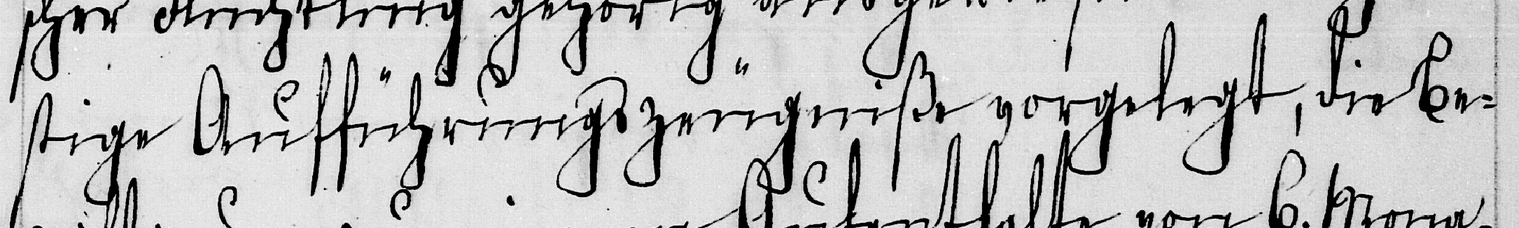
stige Aufführungszeugniße vorgelegt, die Be¬
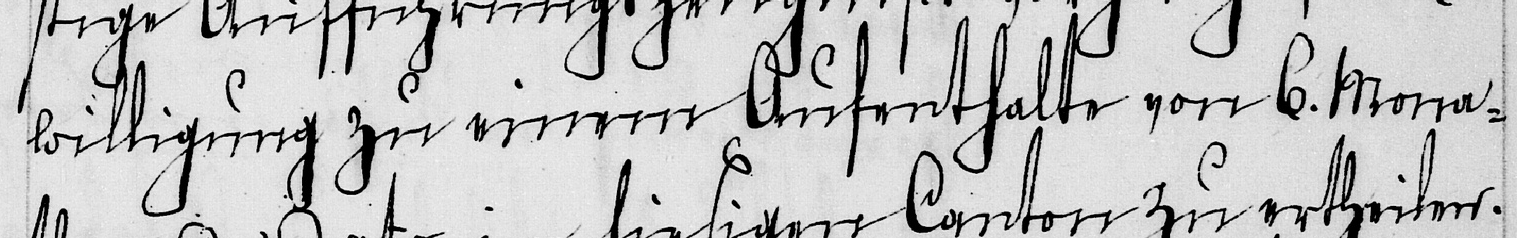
willigung zu einem Aufenthalte von 6. Mona¬
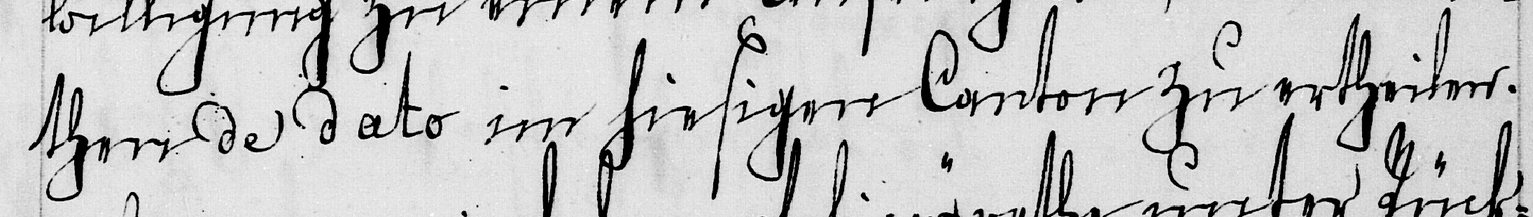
then de dato im hiesigen Canton zu ertheilen.
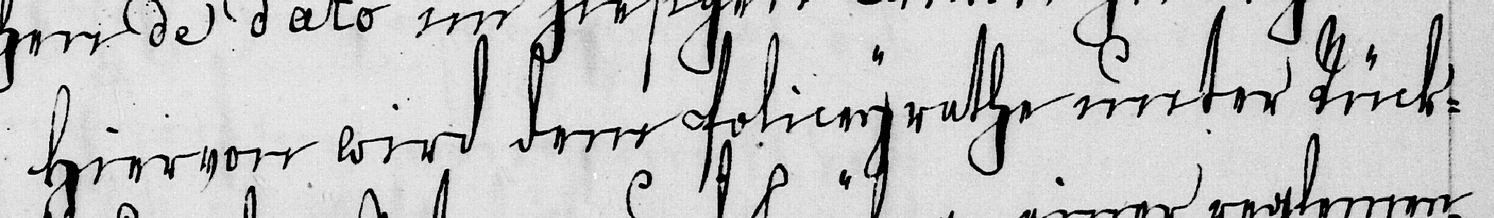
Hiervon wird dem Policeyrathe unter Rück¬
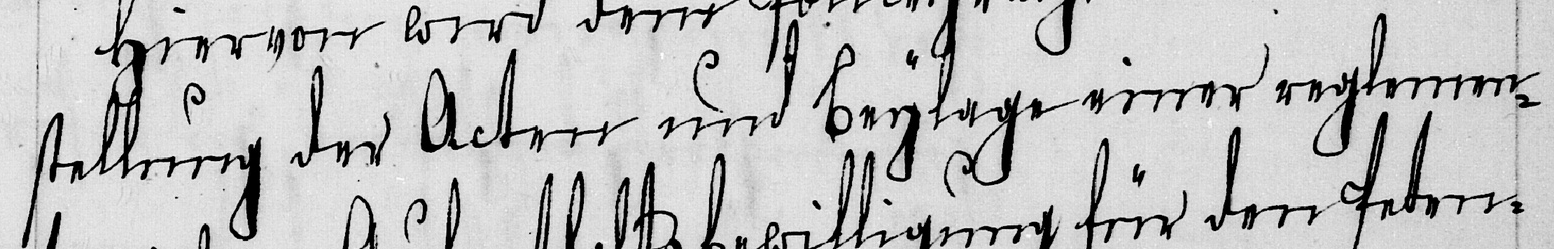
stellung der Acten und Beylage einer reglemen¬
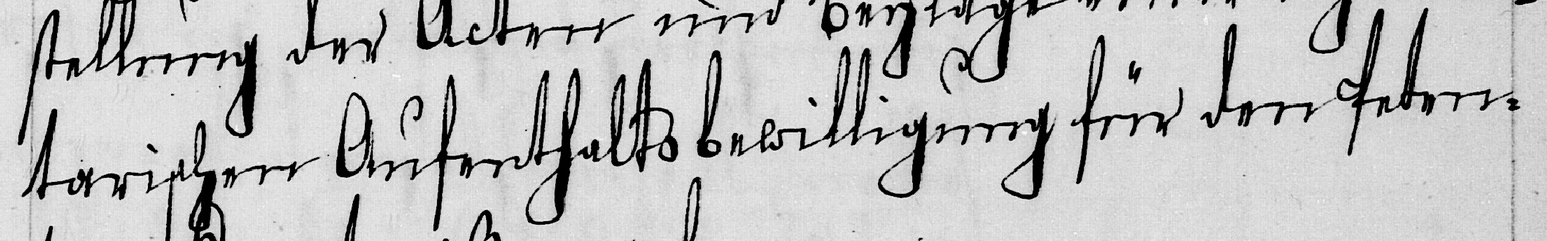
tarischen Aufenthaltsbewilligung für den Paten¬
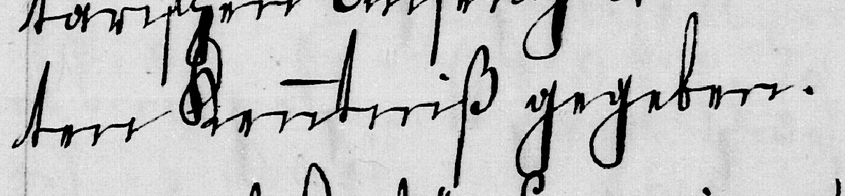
ten Kenntniß gegeben.
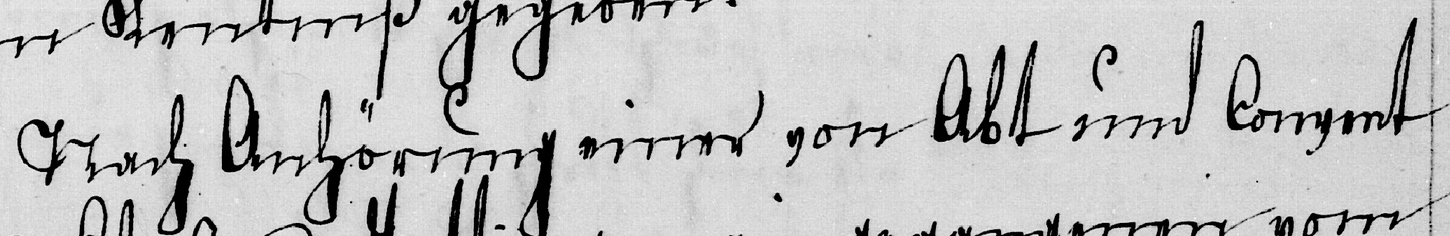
Nach Anhörung einer von Abt und Convent
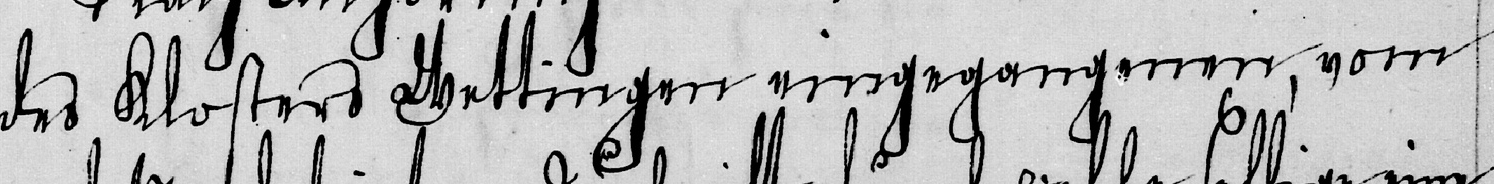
des Klosters Wettingen eingegangenen, vom
